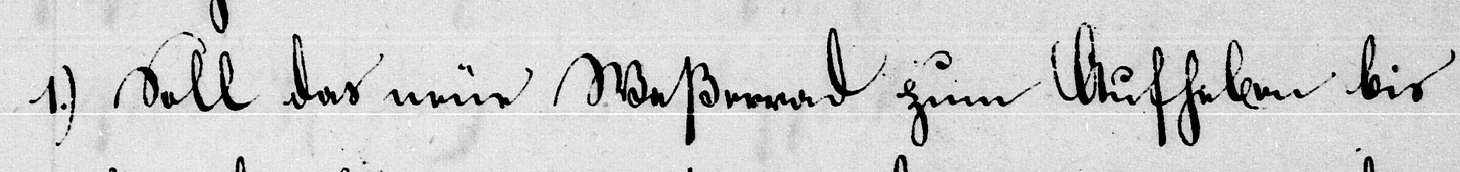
1.) Soll das neue Waßerrad zum Aufheben bis
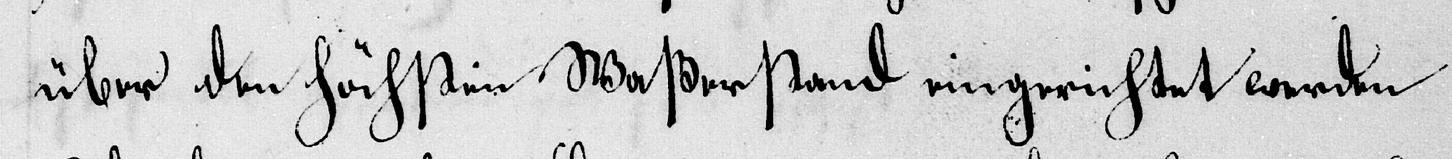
über den höchsten Waßerstand eingerichtet werden
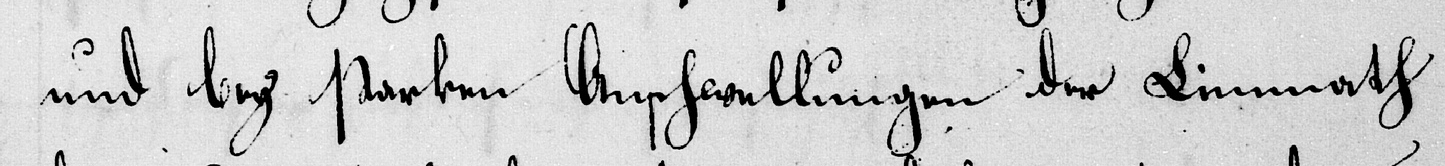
und bey starken Anschwellungen der Limmath
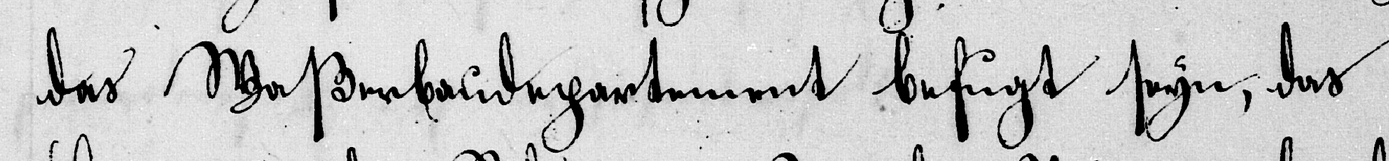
das Waßerbaudepartement befugt seyn, das
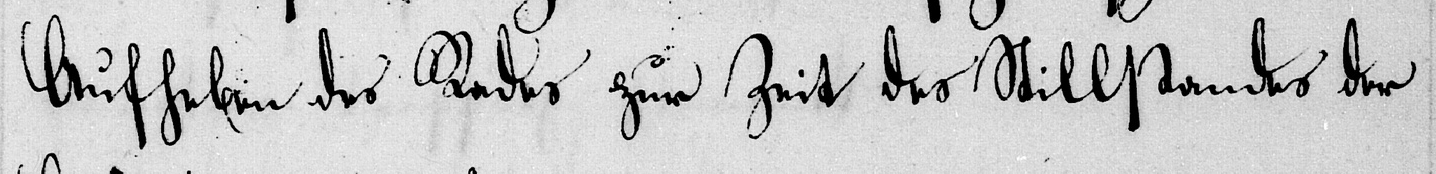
Aufheben des Rades zur Zeit des Stillstandes der
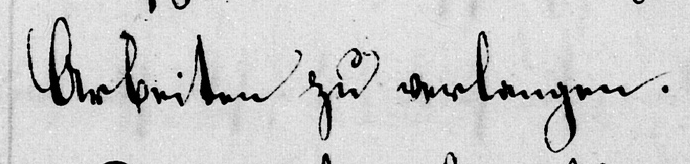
Arbeiten zu verlangen.
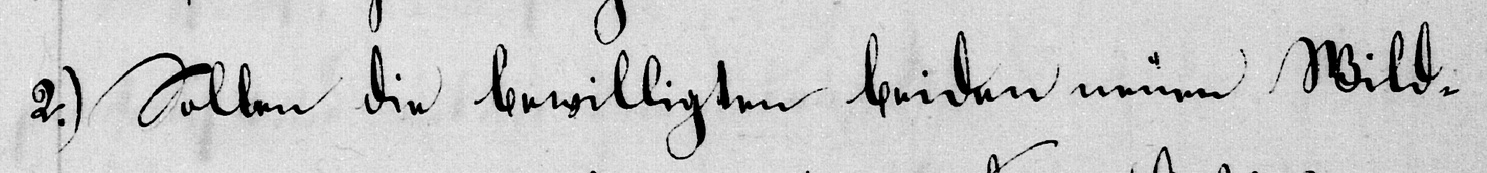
2.) Sollen die bewilligten beiden neuen Wild¬
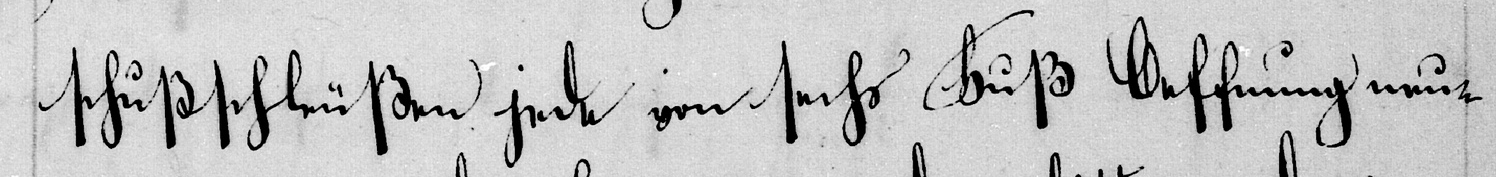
schußschleußen jede von sechs Fuß Oeffnung neu¬
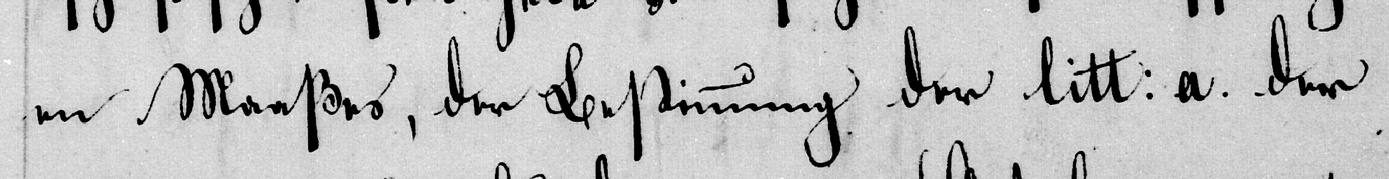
en Maaßes, der Bestimmung der litt: a. der
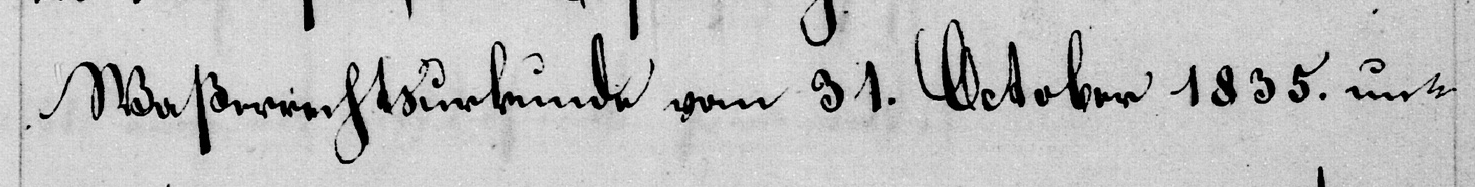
Waßerrechtsurkunde vom 31. October 1835. un-
